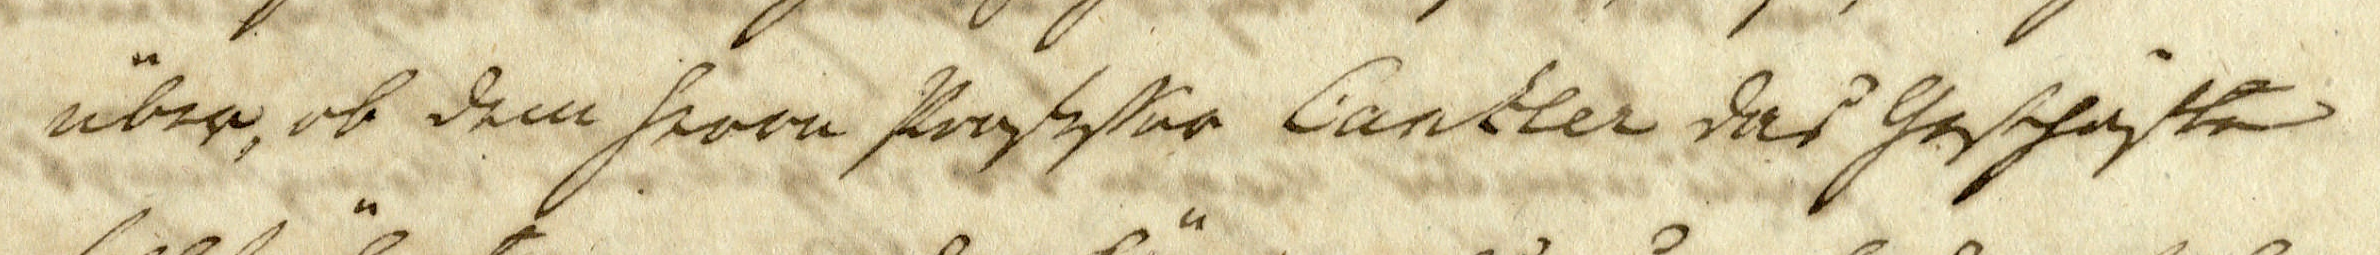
über, ob dem Herrn Professor Canzler das Geschäfte
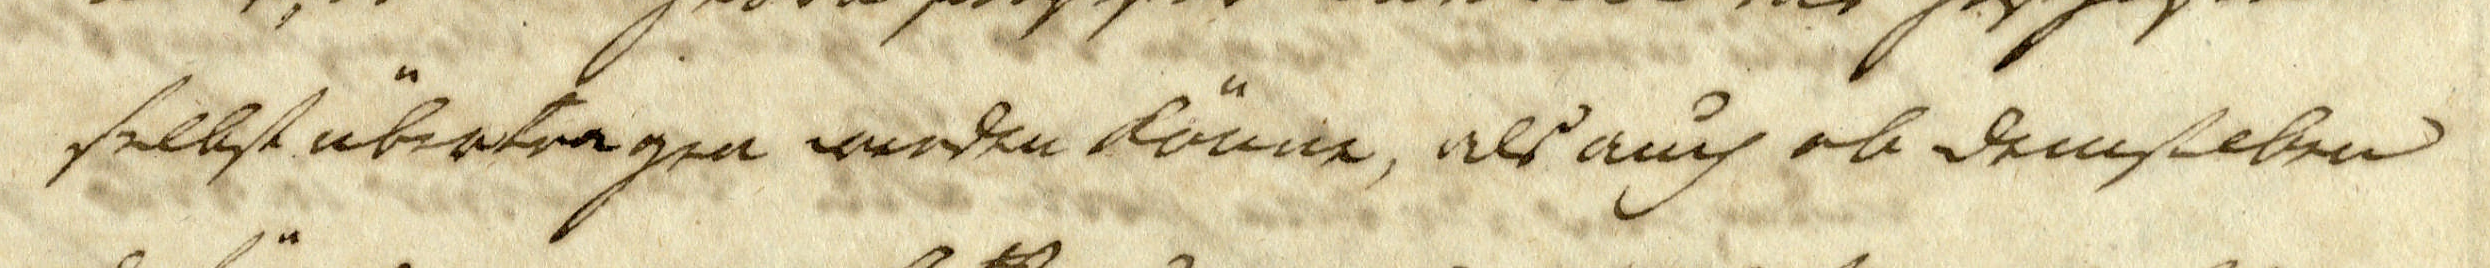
selbst übertragen werden könne, als auch ob demselben
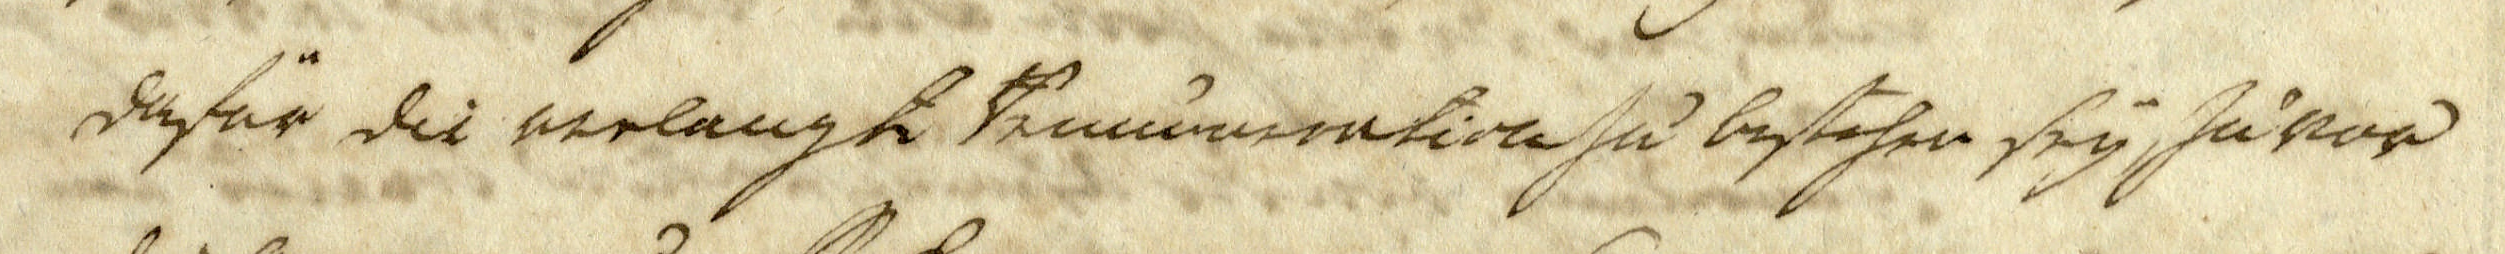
dafür die verlangte Remuneration zu bestehen seÿ, zuvor
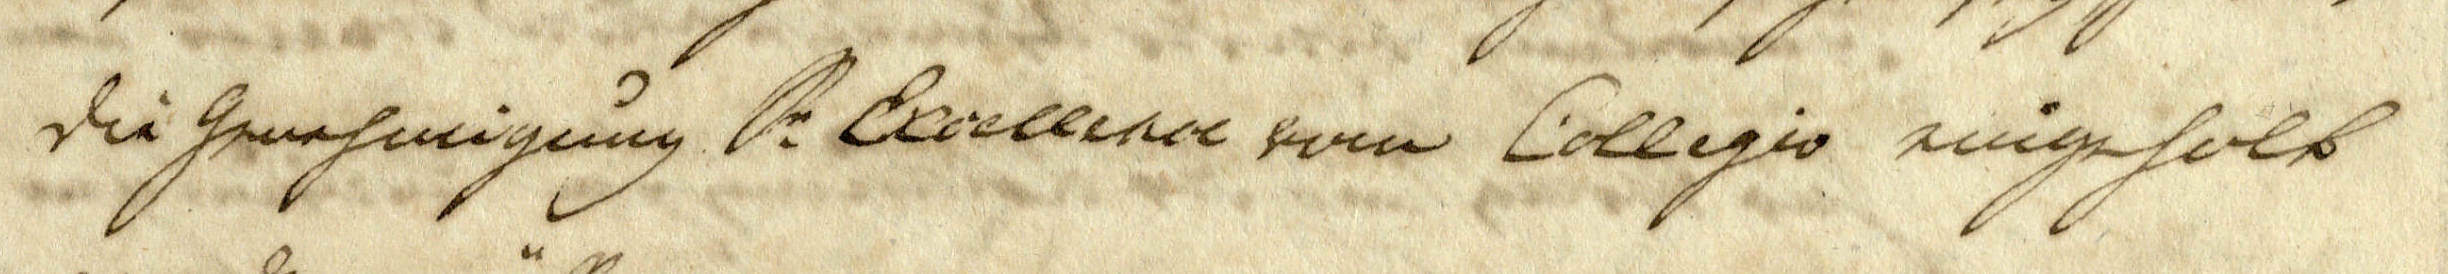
die Genehmigung Sr Excellence vom Collegio eingeholt
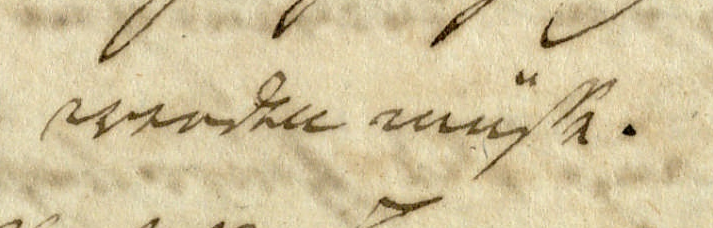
werden müsse.
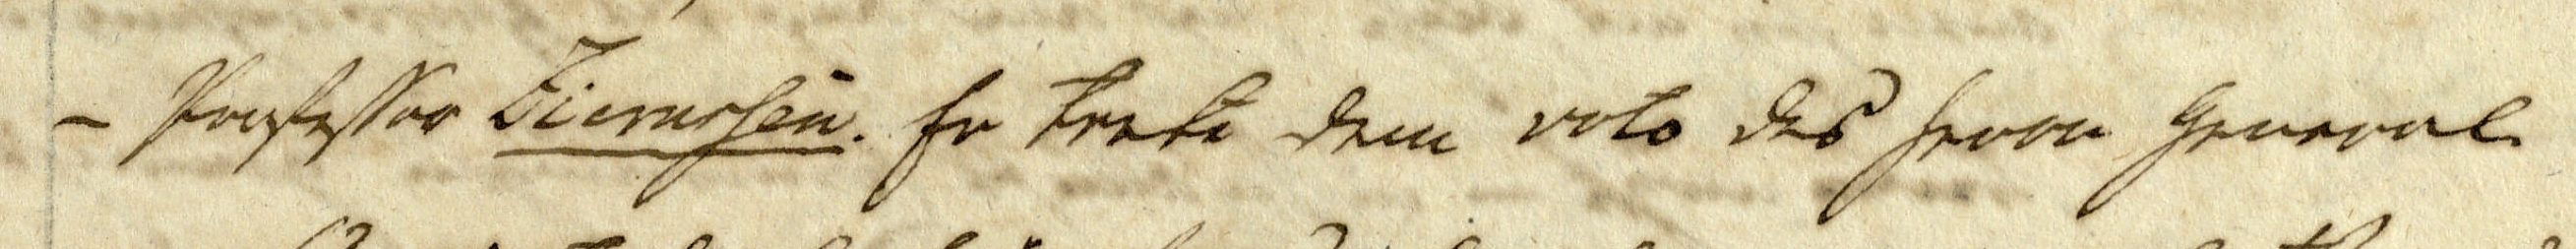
Professor Ziemssen. Er trete dem voto des Herrn General¬
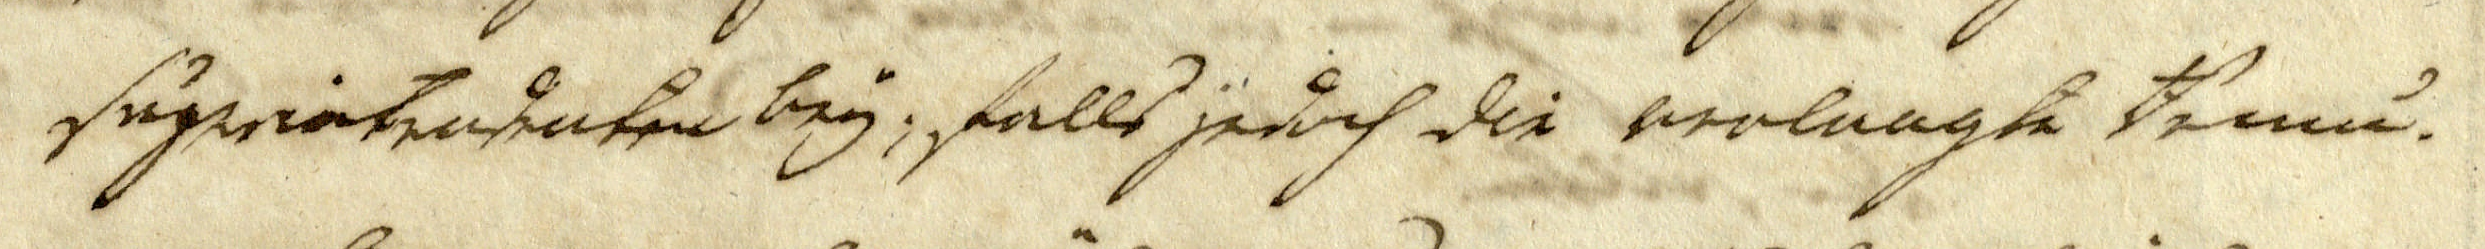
superintendenten beÿ, falls jedoch die verlangte Remu¬
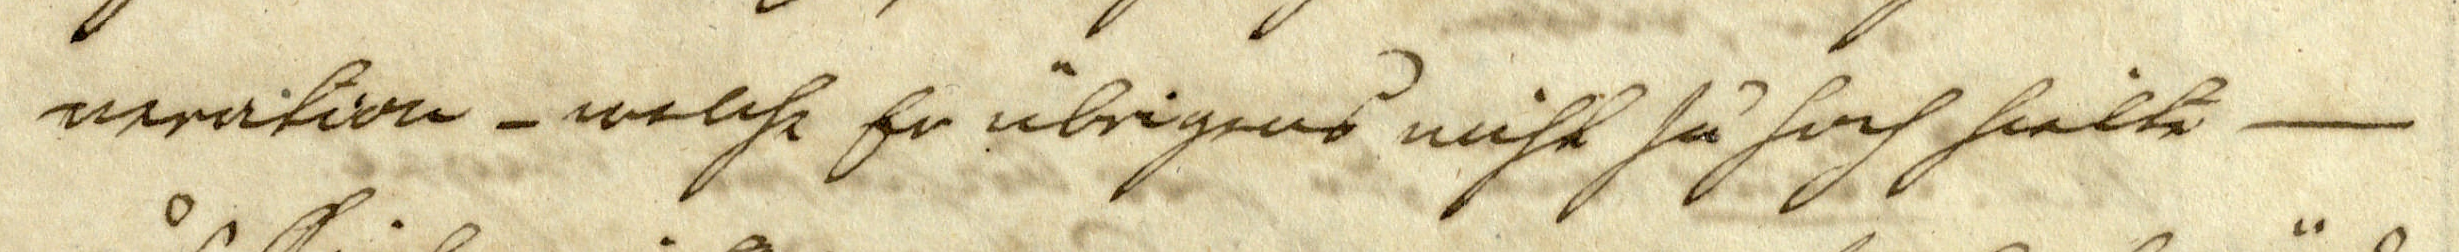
neration - welche Er übrigens nicht zu hoch hielte -
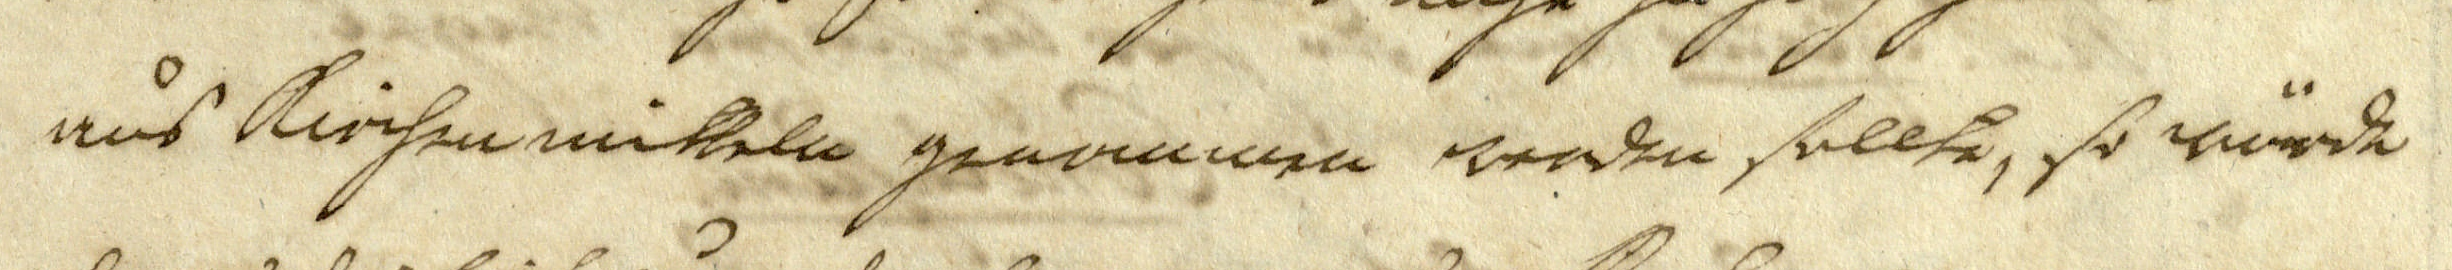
aus Kirchenmitteln genommen werden sollte, so würde
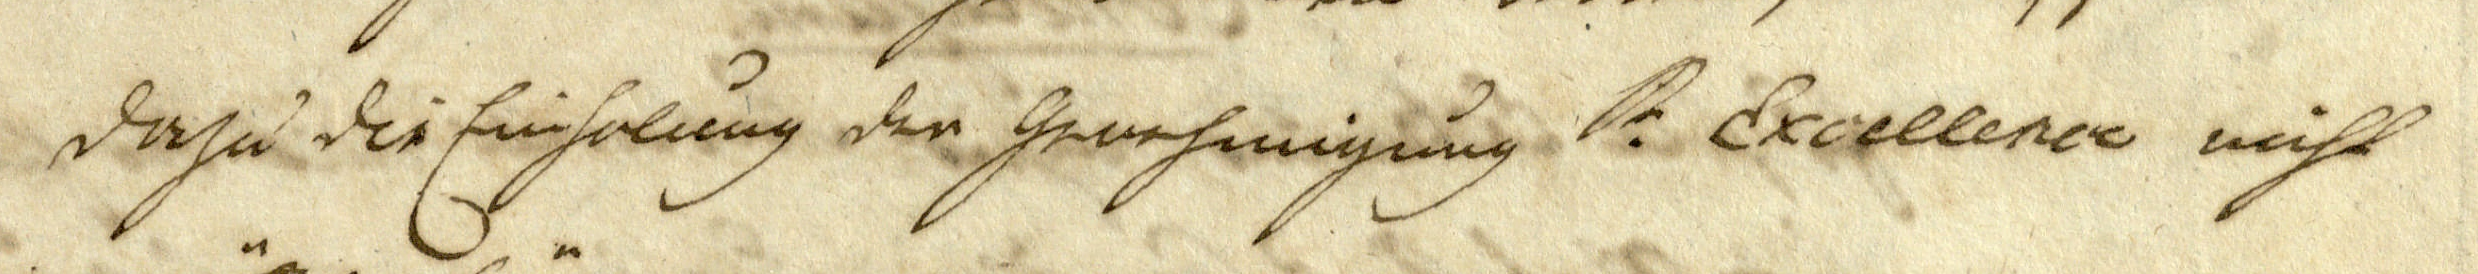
dazu die Einholung der Genehmigung Sr Excellence nicht
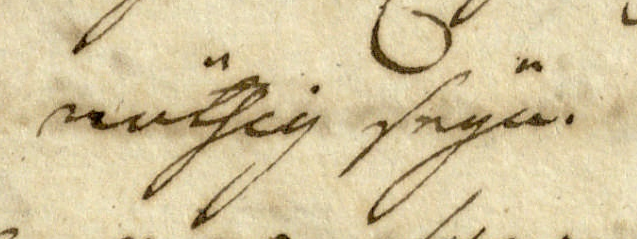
nöthig seÿn.
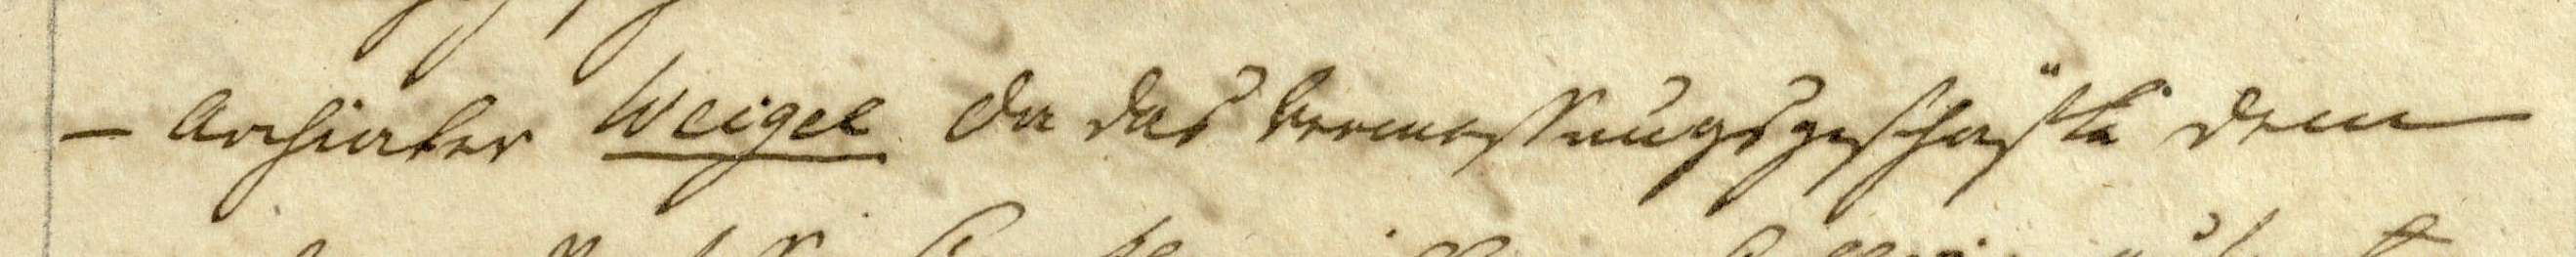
Archiater Weigel. Da das Vermessungsgeschäfte dem
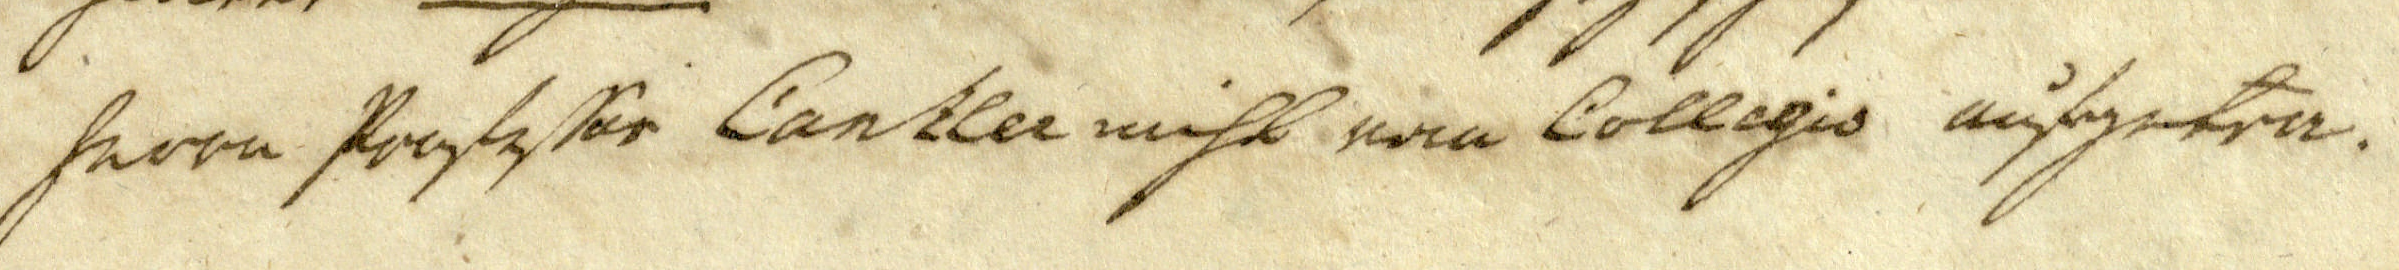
Herrn Professor Canzler nicht vom Collegii aufgetra¬
